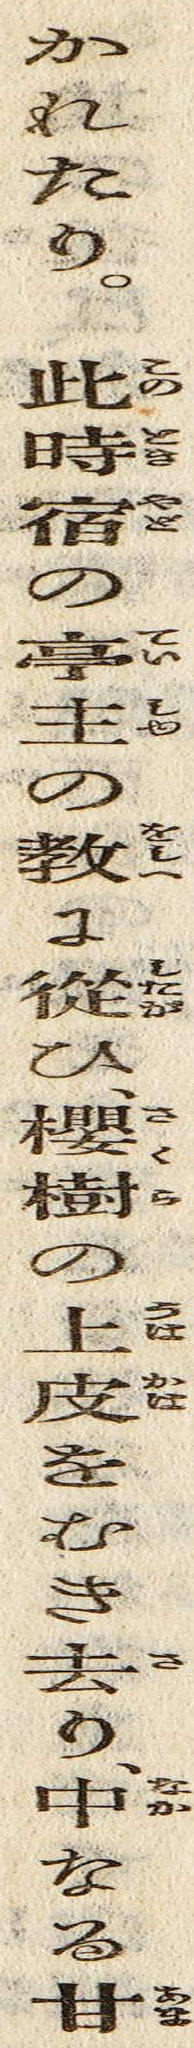かれたり。此時宿の亭主の教に従ひ、桜樹の上皮をむき去り、中なる甘
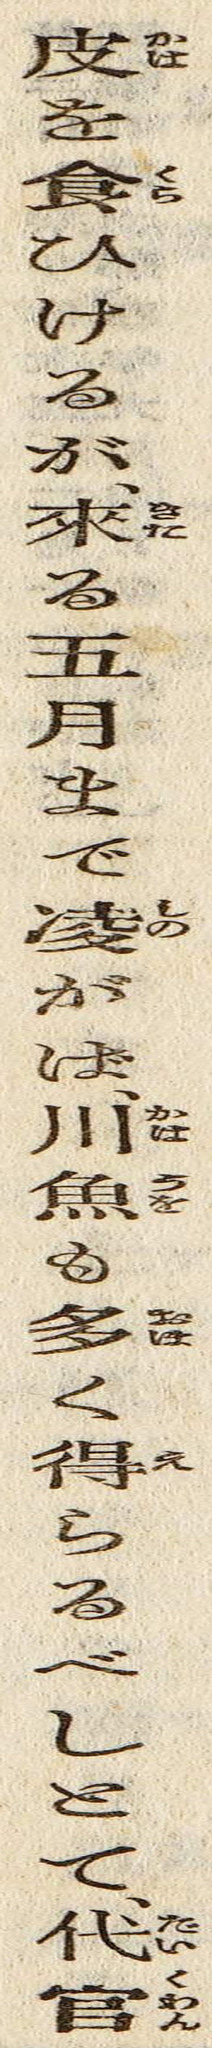皮を食ひけるが、来る五月まで凌がば、川魚も多く得らるべしとて、代官
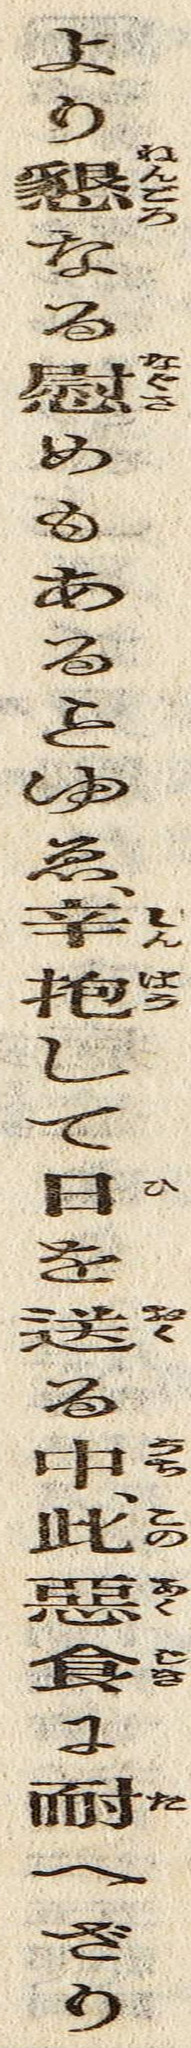より懇なる慰めもあることゆえ、辛抱して日を送る中此悪食に耐へざり
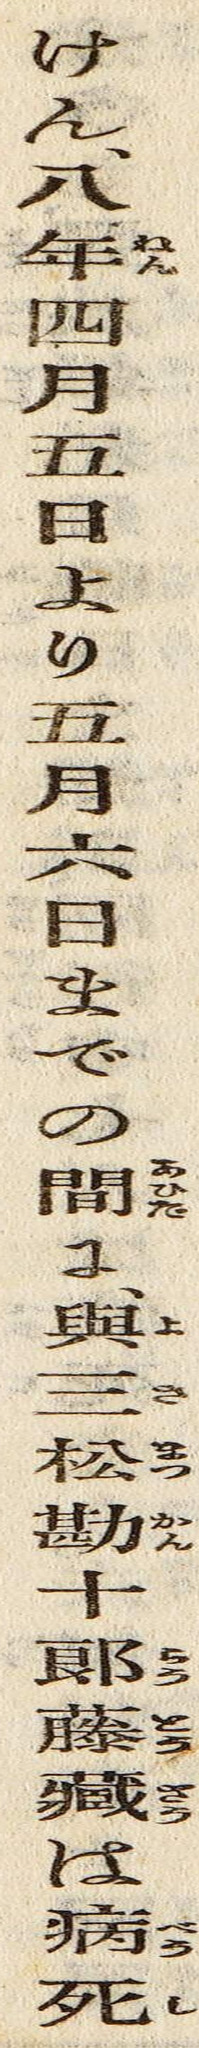けん、八年四月五日より五月六日までの間に与三松勘十郎藤蔵は病死
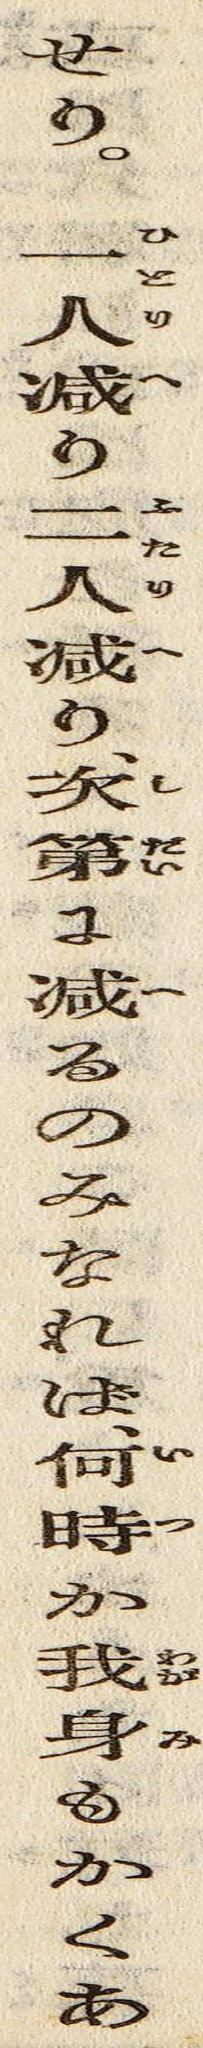せり。一人減り二人減り、次第に減るのみなれば、何時か我身もかくあ
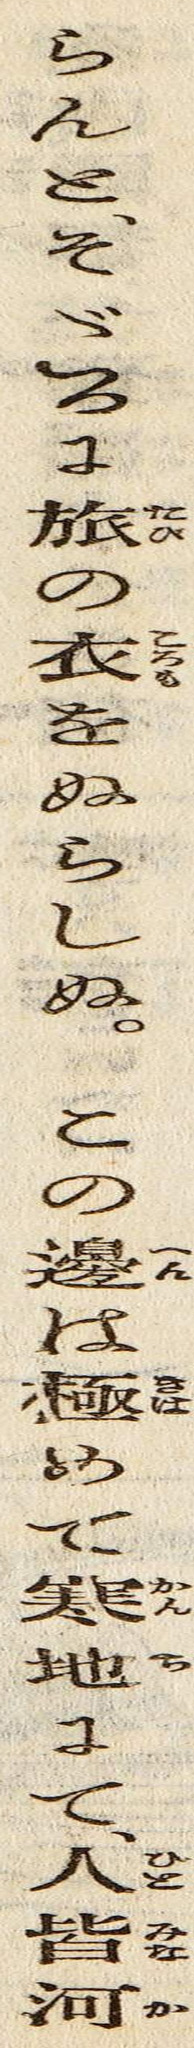らんと、そゞろに旅の衣をぬらしぬ。この辺は極めて寒地にて、人皆河
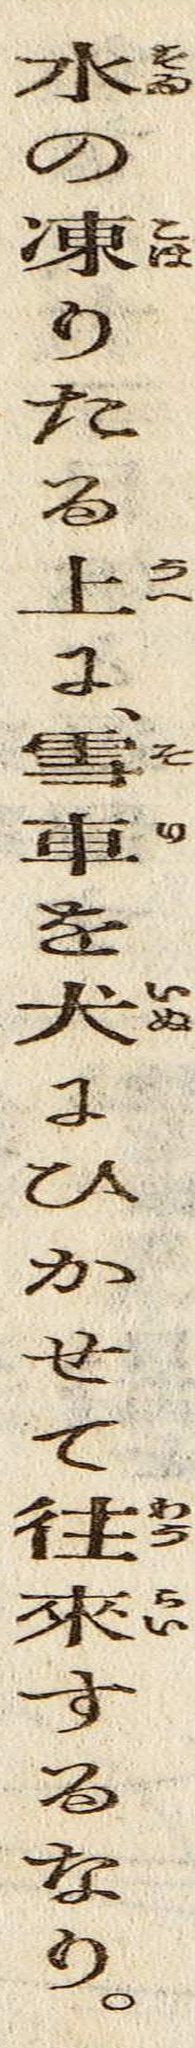水(すい)の凍りたる上に、雪車を犬にひかせて往来するなり。
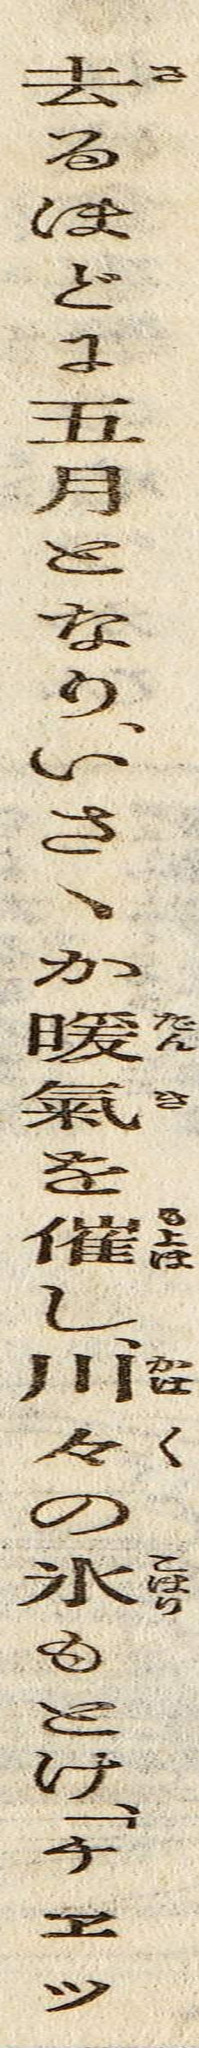去るほどに五月となり、いさゝか暖気を催し、川々の氷も溶け、チエツ
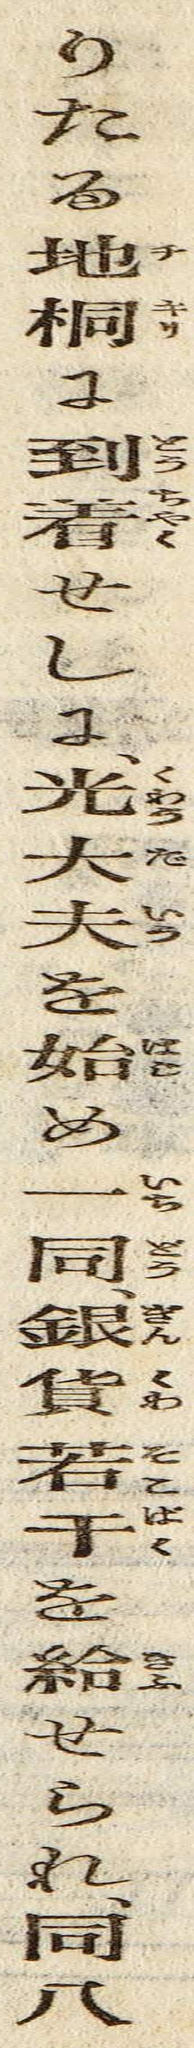りたる地桐に到着せしに、光大夫を始め一同、銀貨若干を給せられ、同八
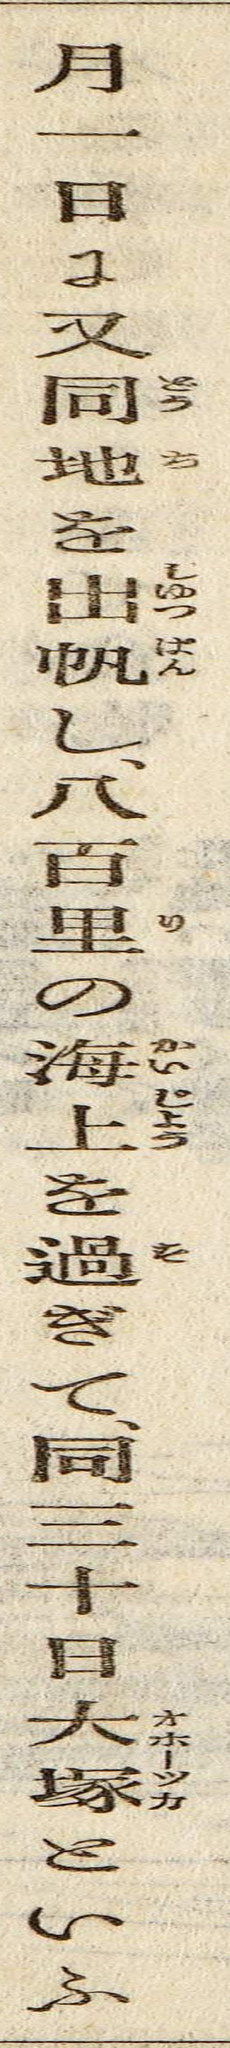月一日に又同地を出帆し、八百里の海上を過ぎて、同三十日大塚といふ
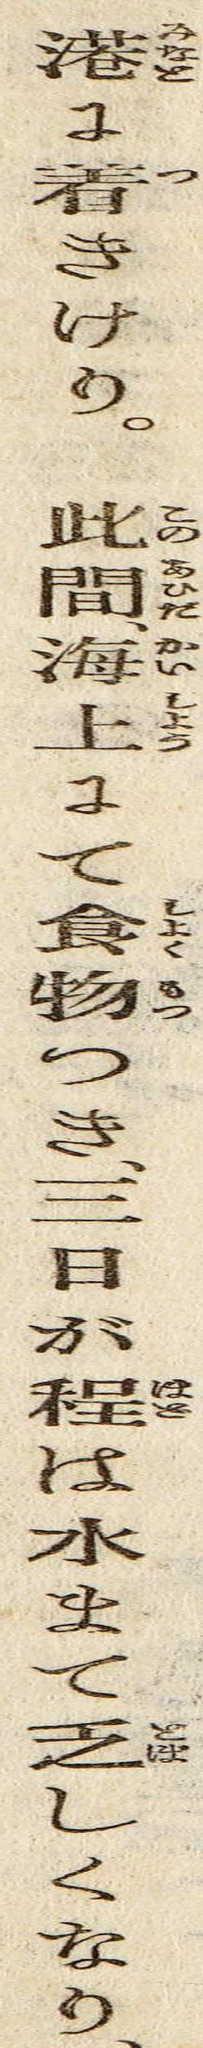港に着きけり。此間、海上にて食物つき、三日が程は水まて乏しくなり、

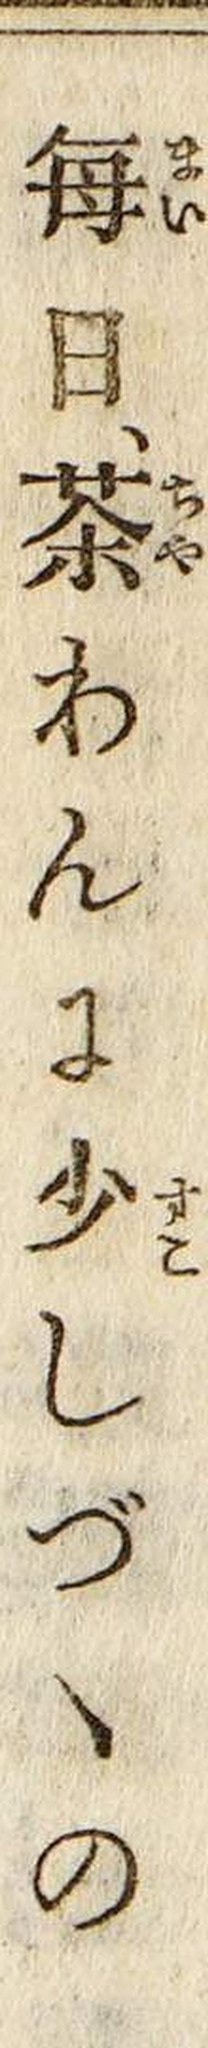毎日、茶わんに少しづゝの
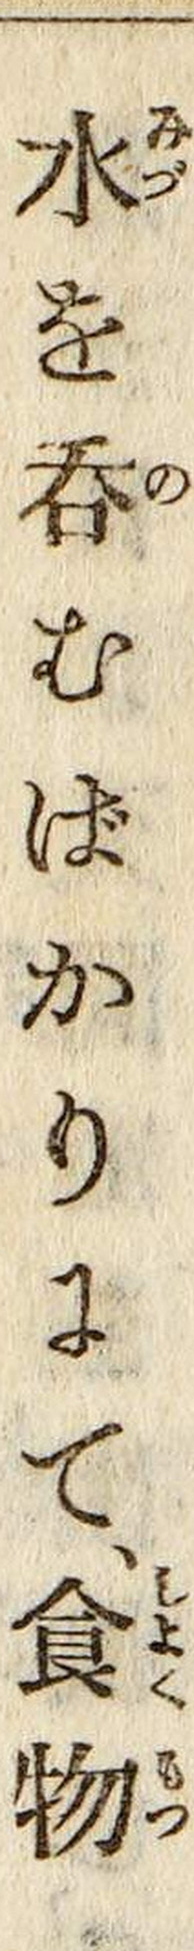水を呑むばかりにて、食物
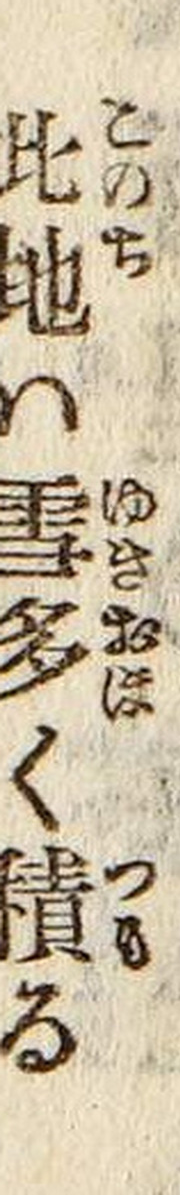此地ハ雪多く積る
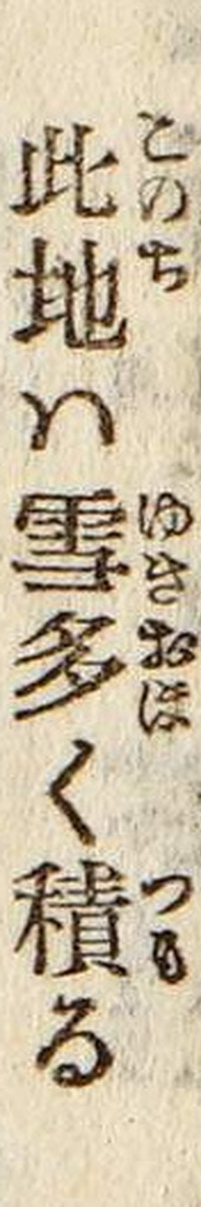此地ハ雪多く積る
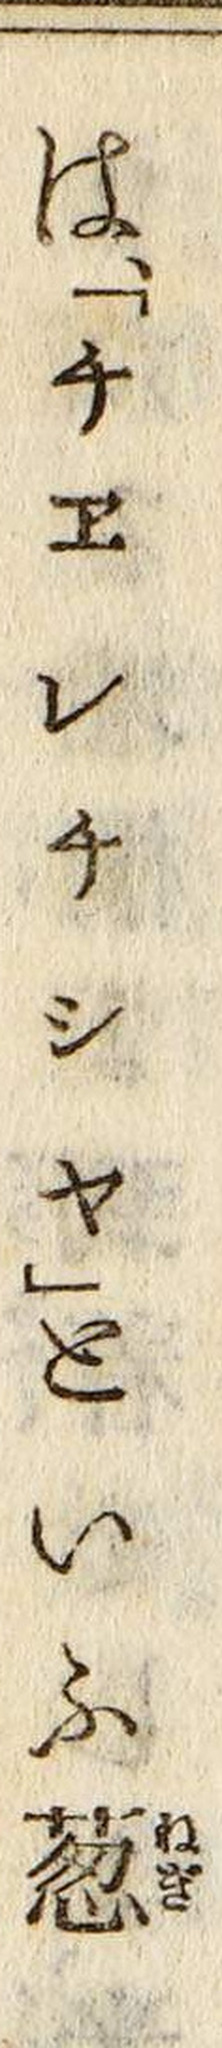は、「チエレチシヤ」といふ葱
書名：日本漂流譚
